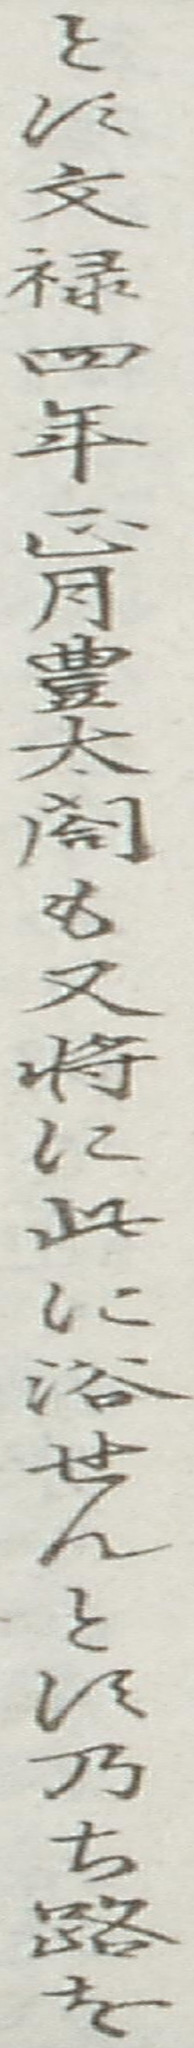とし文禄四年正月豊太閤も又将に此に浴せんとす乃ち路を
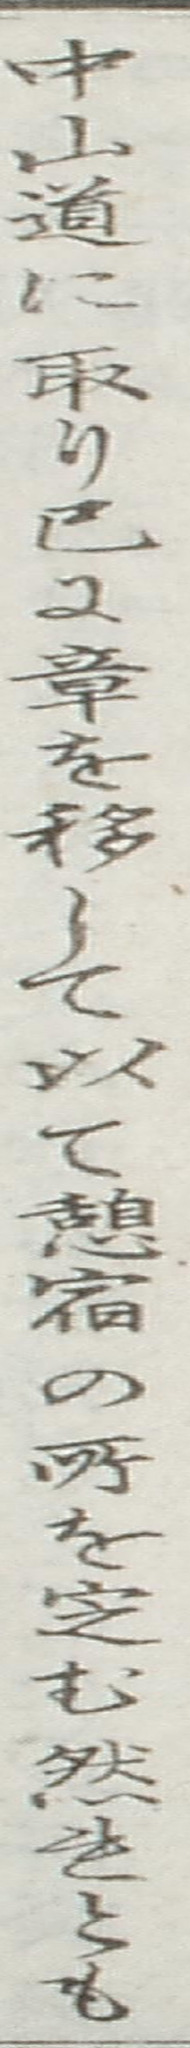中山道に取り己は章を移して以て憩宿の所を定む然れとも
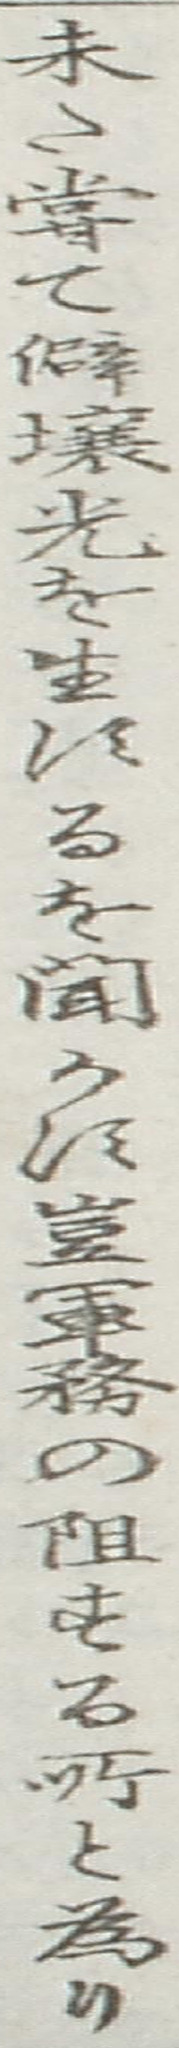未た嘗て僻壌光を生するを聞かす豈軍務の阻する所と為り

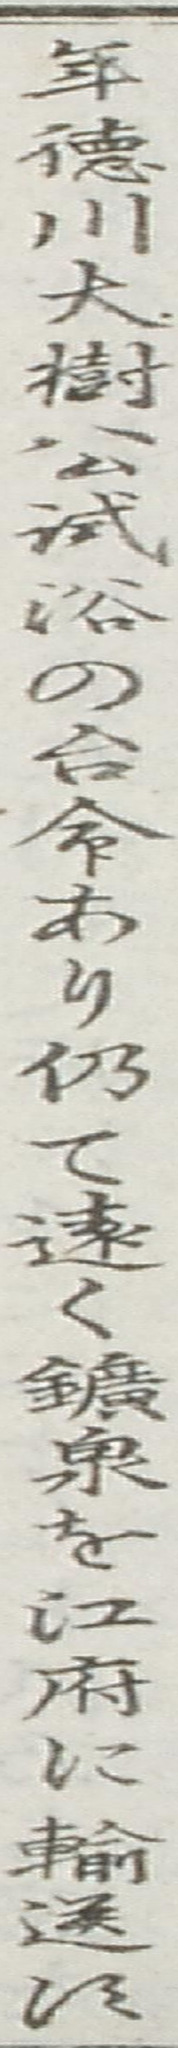年徳川大樹公試浴の台命あり仍て遠く鉱泉を江府に輸送し
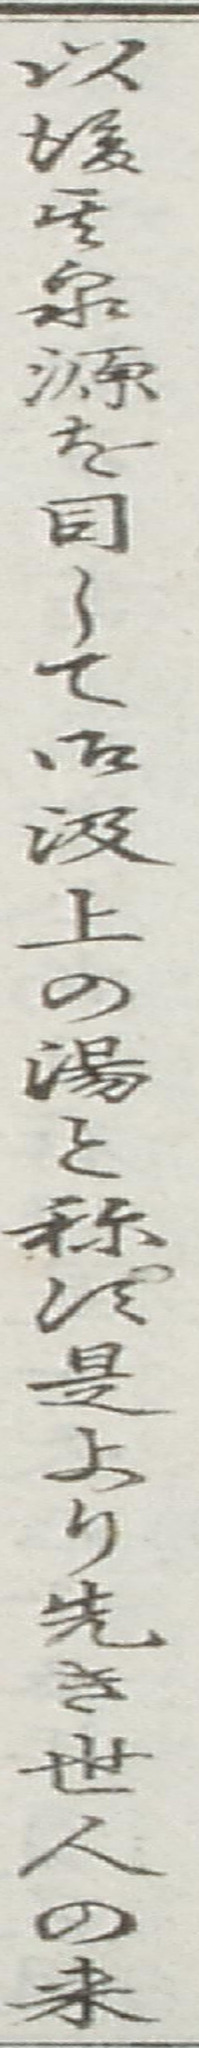以後其泉源を目して御汲上の湯と称し是より先き世人の来
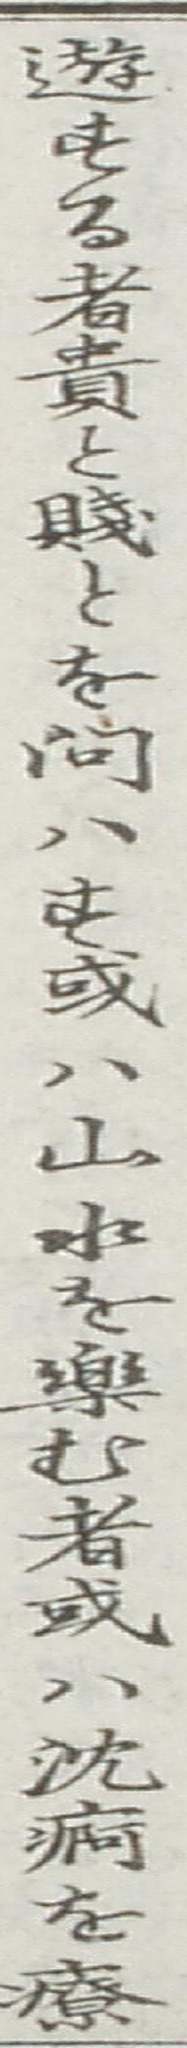遊する者貴と賤とを問はす或は山水を楽しむ者或は沈痾を療
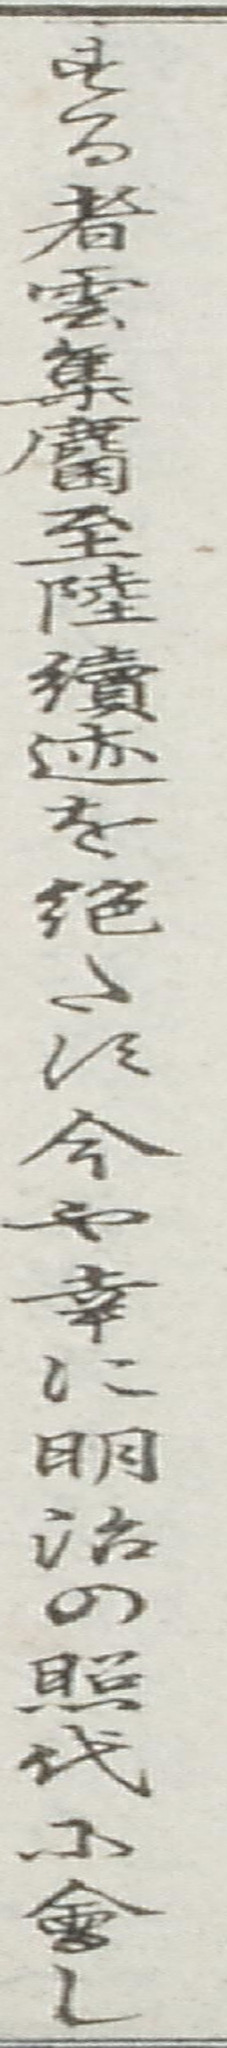する者雲集麕至陸續迹を絶たす今や幸に明治の昭代に會し
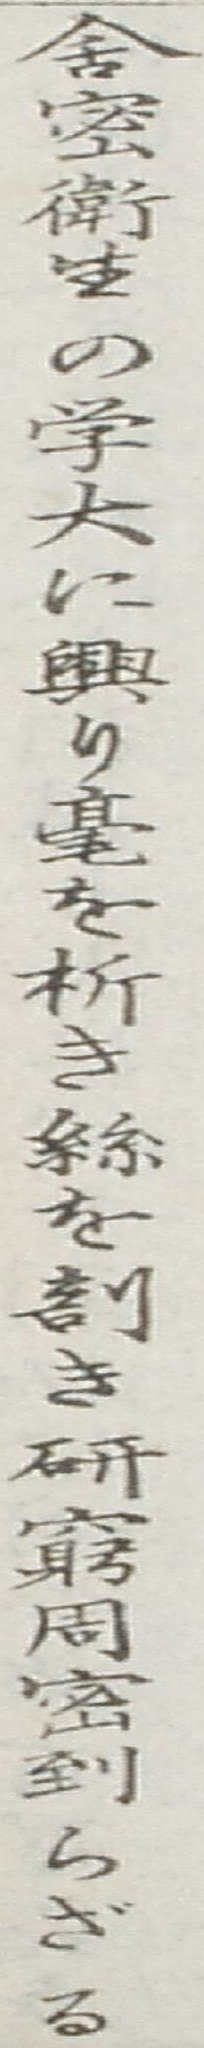舎密衛生の学大に興り毫を析き糸を割き研究周密到らざる
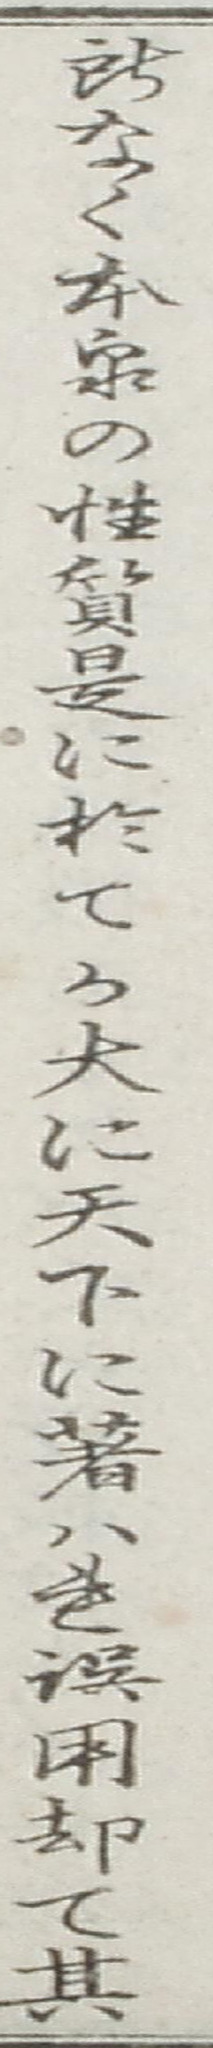所なく本泉の性質是に於て多大に天下に著はす誤用却て其
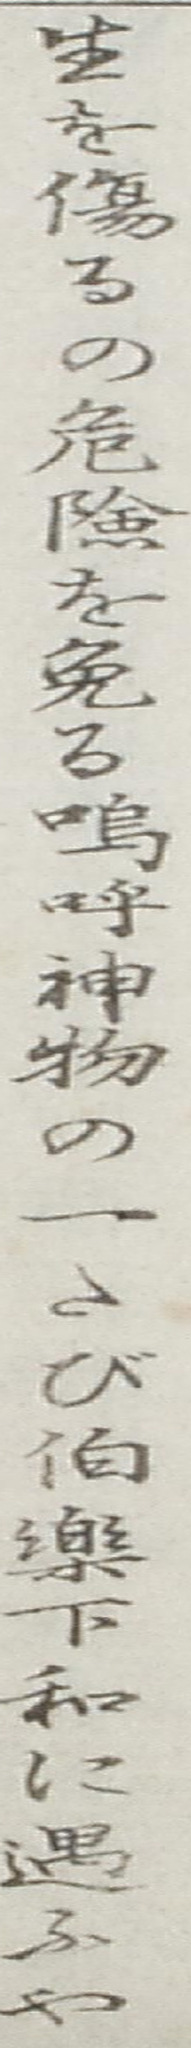生を傷るの危険を免る嗚呼神物の一たび伯楽下知に遭ふや
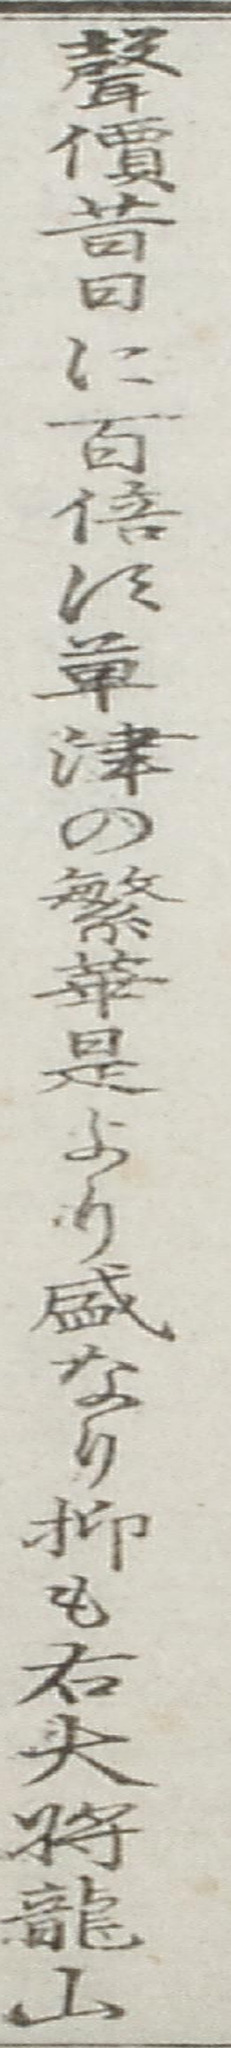聲價昔日に百倍し草津の繁華是より盛なり抑も右大将龍山
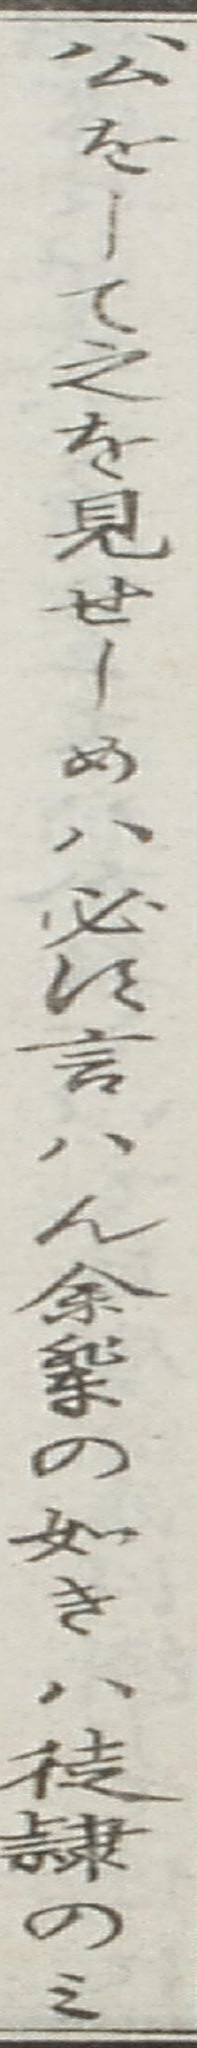公をして之を見せしめは必す言はん余楽の如きは徒隷のみ
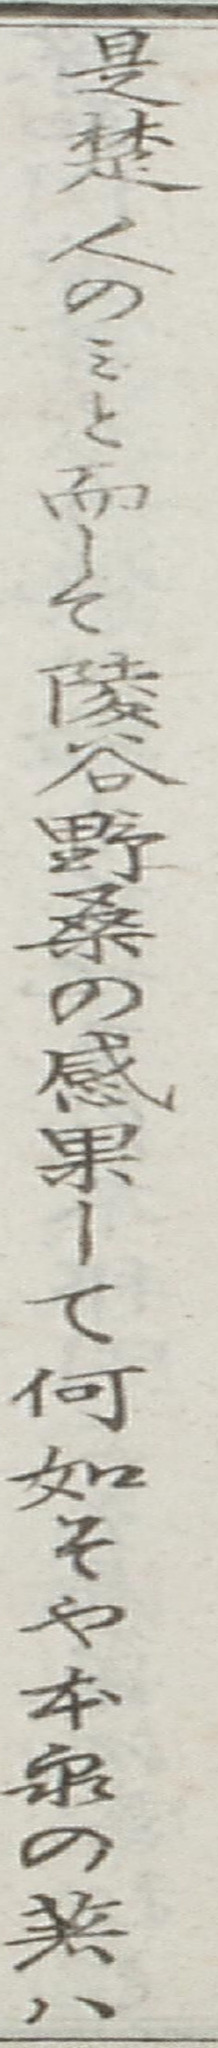是楚人のみと而して陵谷野桑の感果して何如そや本泉の著は
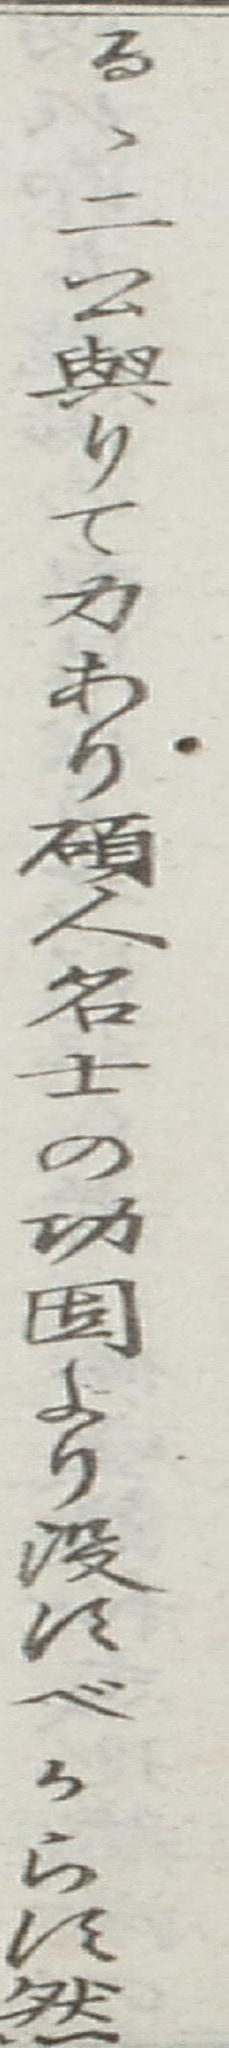るゝ二こ興りて力あり碩人名士の功固より没しべからし然
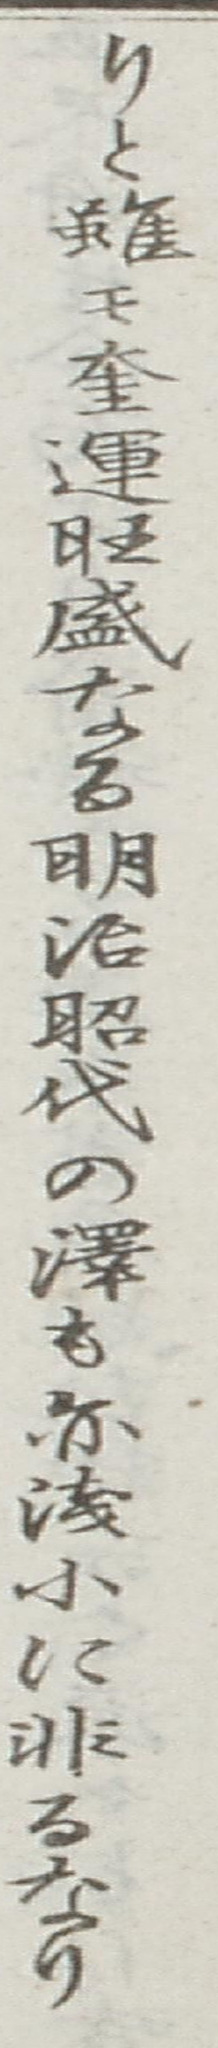りと雖も奎運旺盛なる明治昭代の澤も亦浅小に非るなり
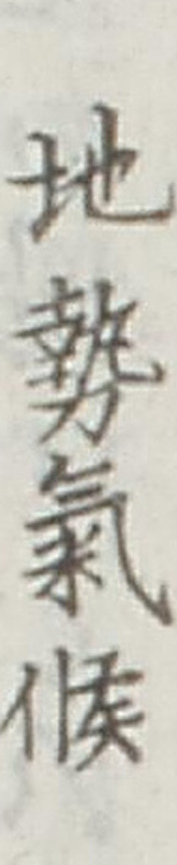地勢気候
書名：草津温泉誌　全
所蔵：東京大学地震研究所図書室 Earthquake Research Institute Library, The University of Tokyo, JAPAN
